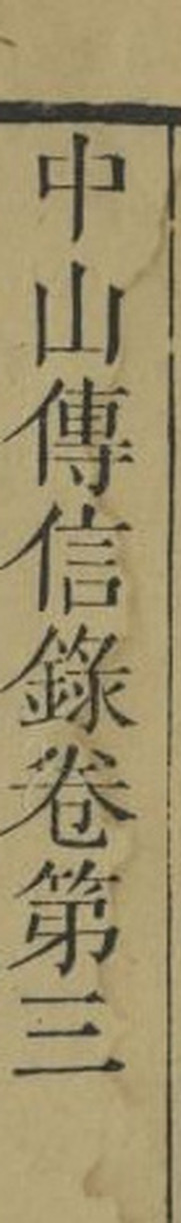中山伝信録巻第三

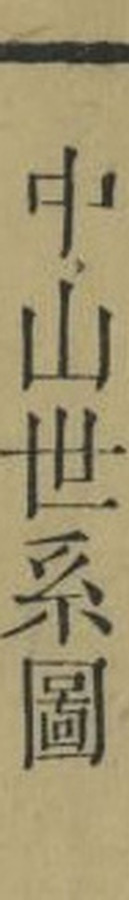中山世系図

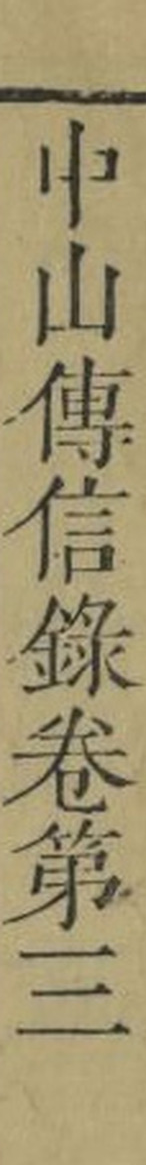中山伝信録巻第三
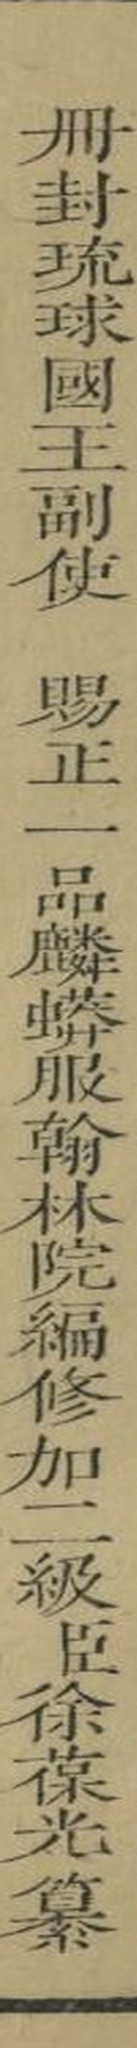冊封琉球国王副使賜正一品麟蟒服翰林院編修加二級臣徐葆光纂
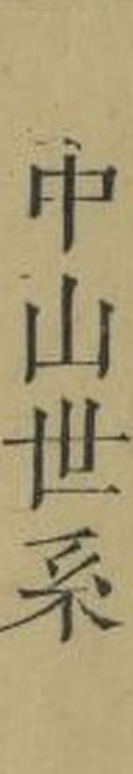中山世系
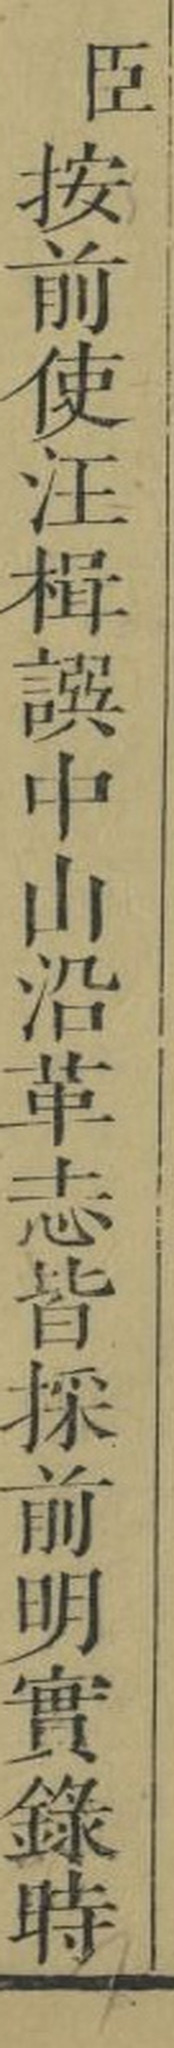臣按前使汪楫誤中山沿革志皆採前明実録時
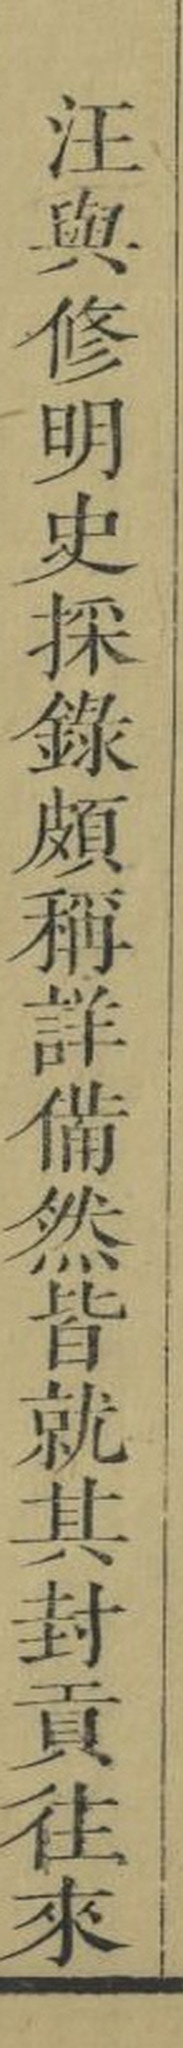汪与修明史採録頗称詳備然皆就其封貢往来
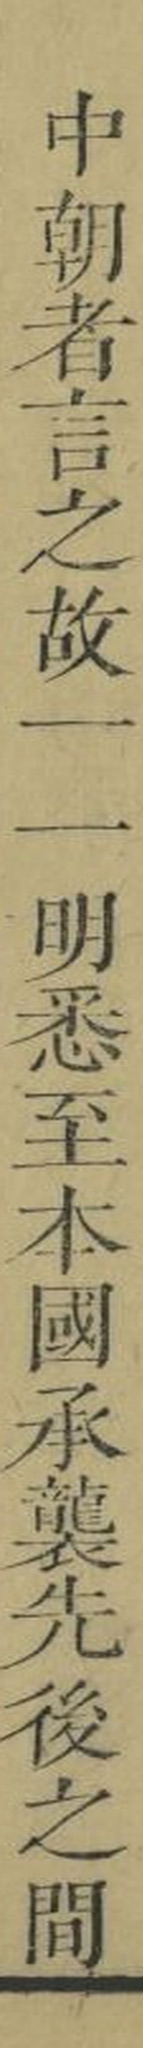中朝者言之故一一明悉至本国承襲先後之間
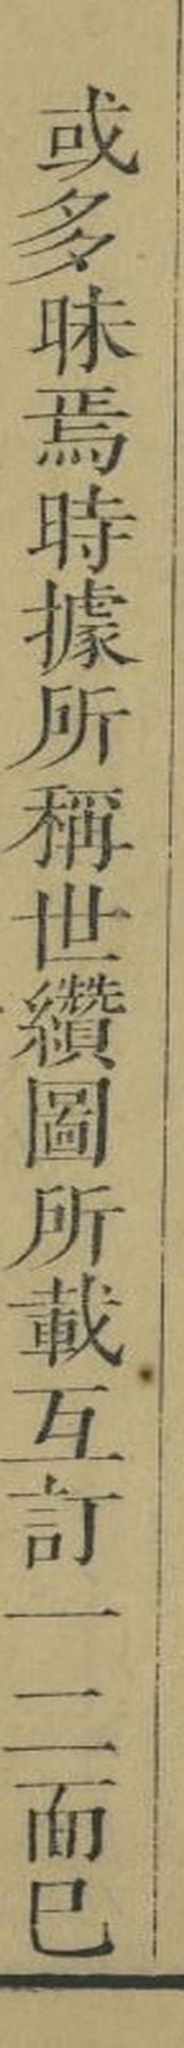或多昧焉時拠所称世纘図所載互訂一二而已
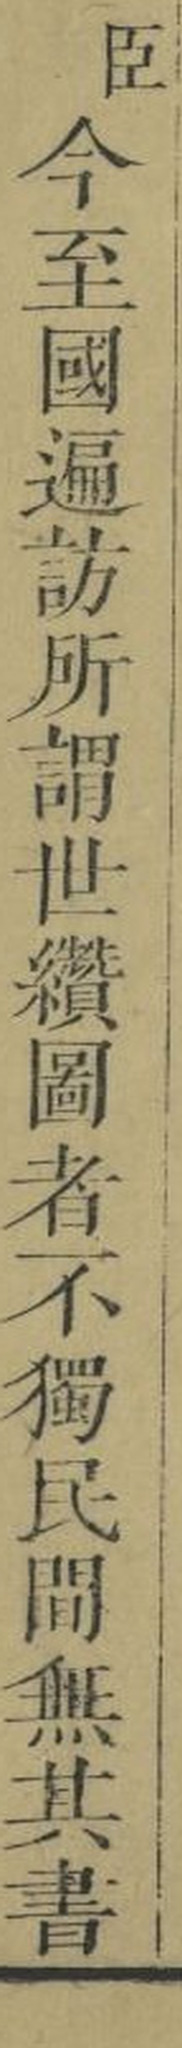臣今至国遍訪所謂世纘図者不独民間無其書
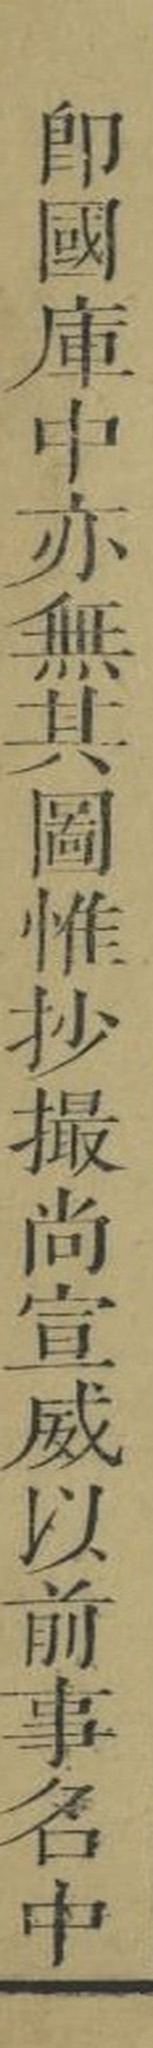即国庫中亦無其図惟抄撮尚宣威以前事名中

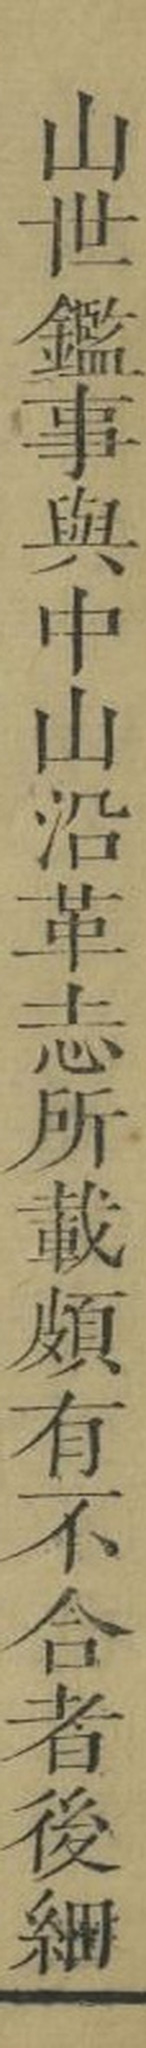山世鑑事与中山沿革志所載頗有不合者後細
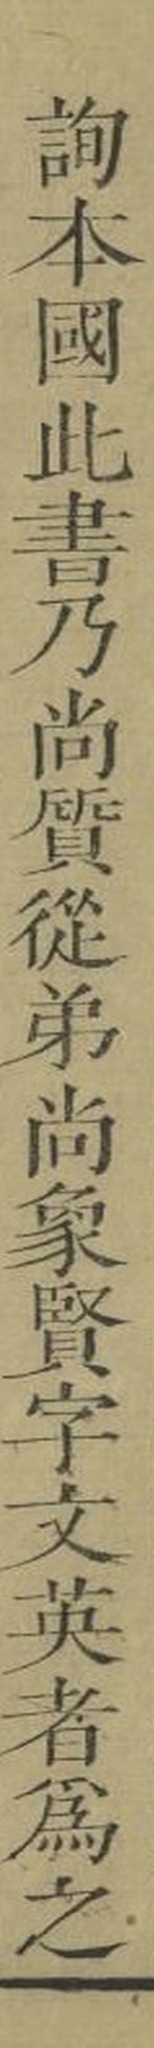詢本国此書乃尚質従弟尚象賢字文英者為之
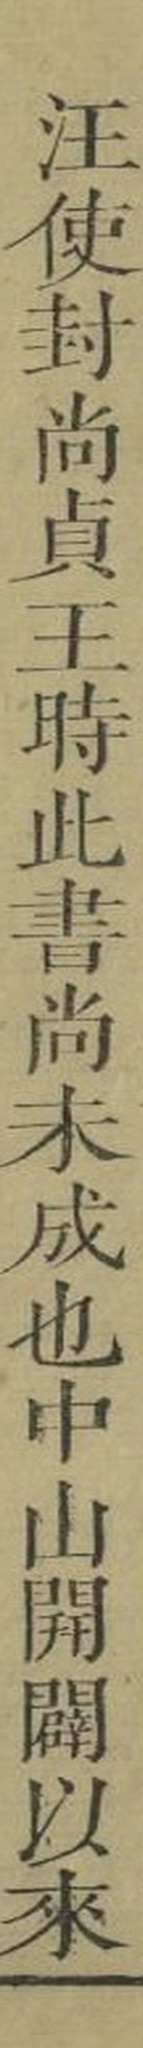汪使封尚貞王時此書尚未成也中山開闢以来
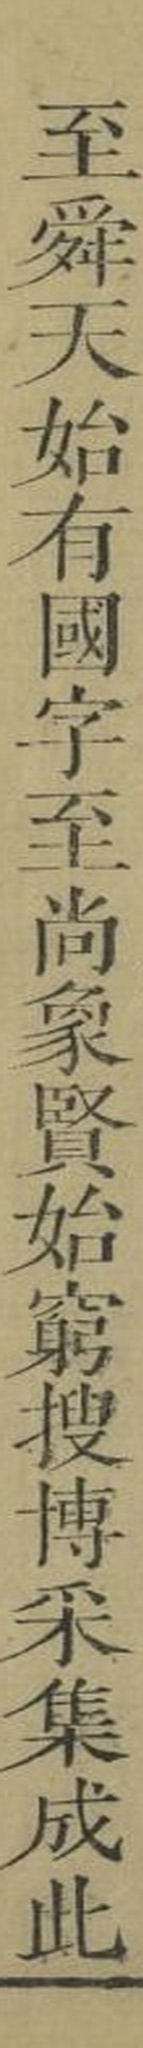至舜天始有国字至尚象賢始窮捜博采集成此
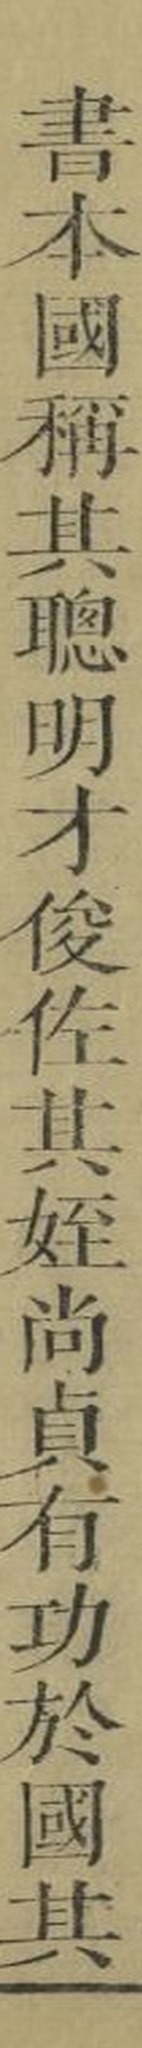書本国称其聡明才俊佐其姪尚貞有功於国其
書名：中山伝信録 巻三
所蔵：University of the Ryukyus Library
